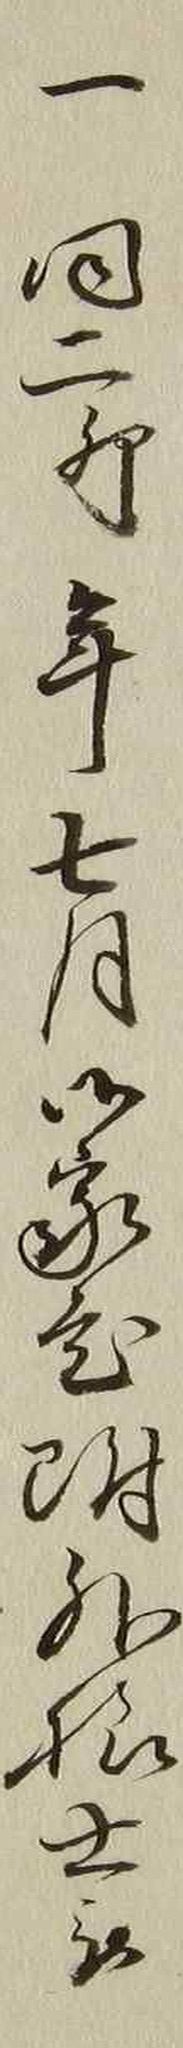一同二卯年七月御家老附外様士被
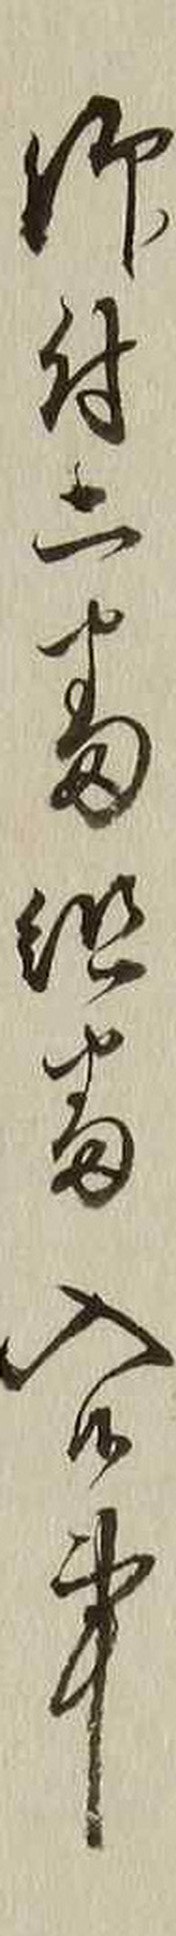仰付二番組番入候事
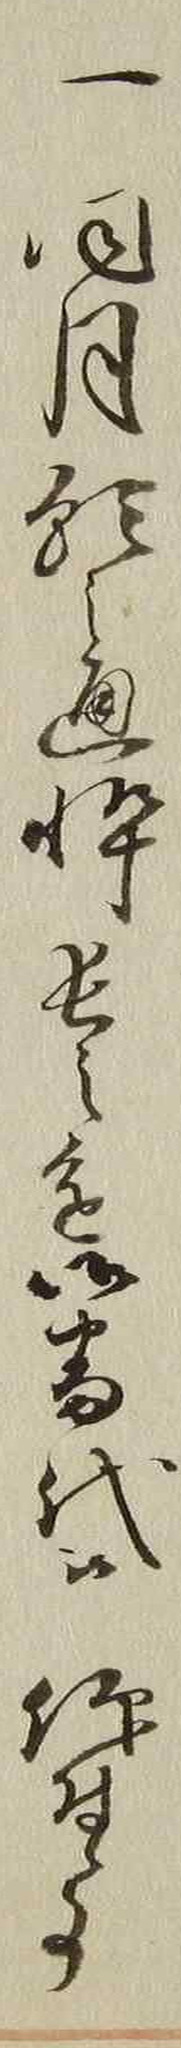一同月願之通忰長之進御番代被仰付候事
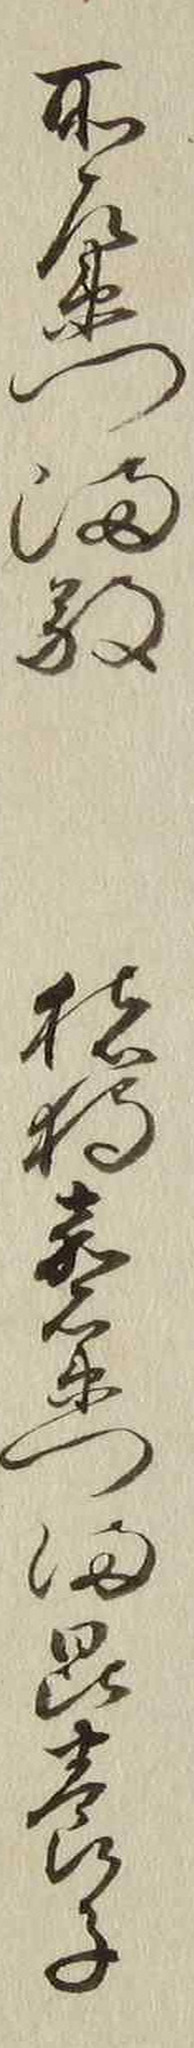所左衛門満敬猪狩嘉右衛門満昆養子
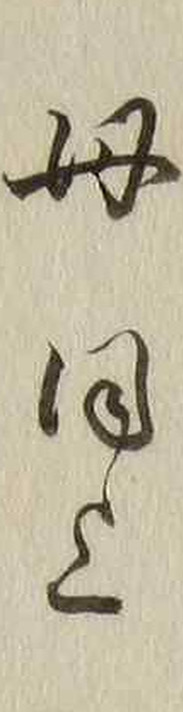母同上
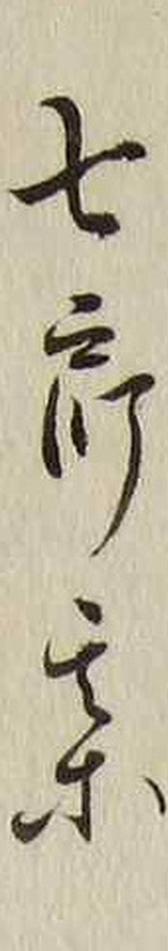七郎某
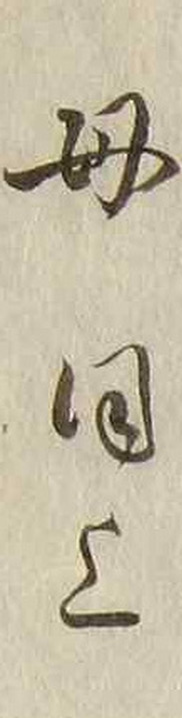母同上

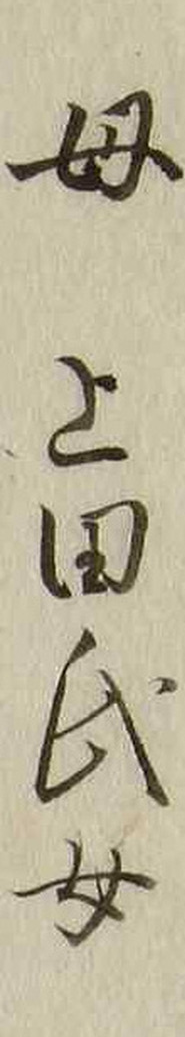母上田氏女
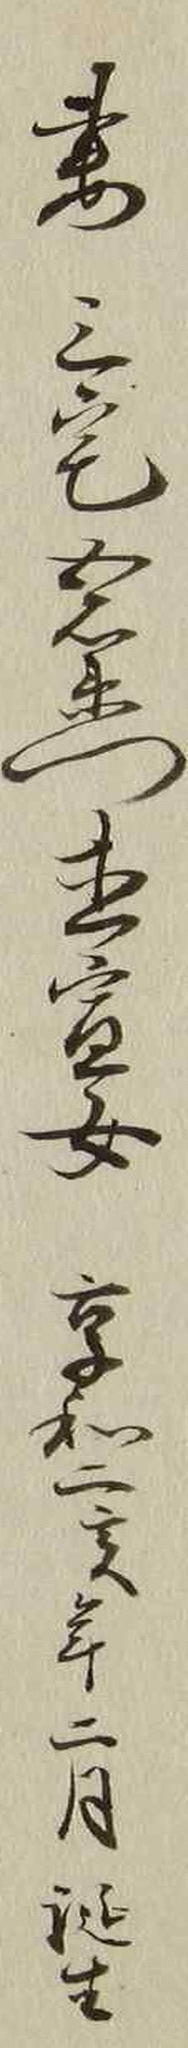妻三宅五右衛門直宣女享和二亥年二月誕生
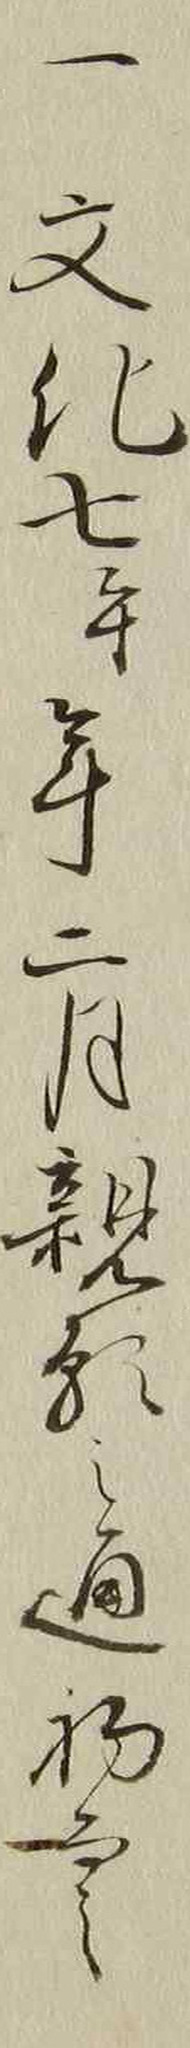一文化七午年二月親願之通初而之
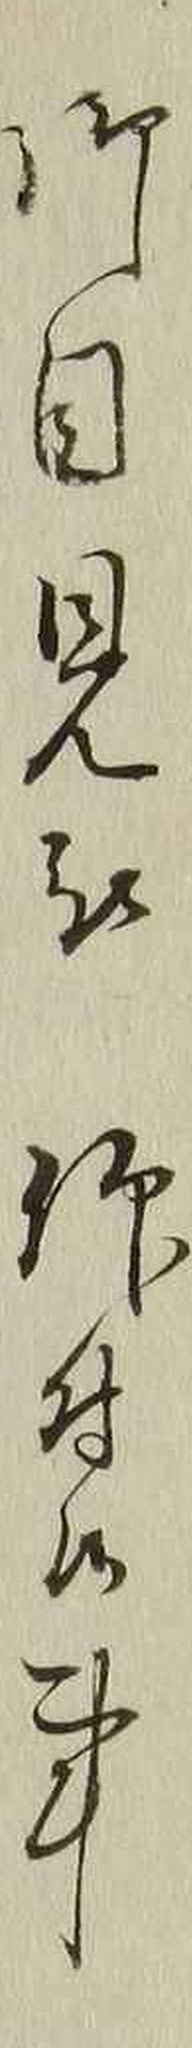御目見被仰付候事
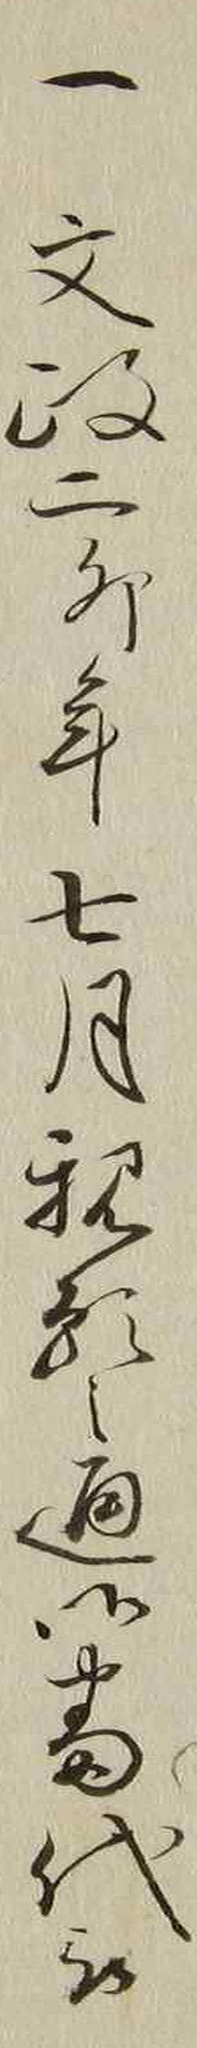一文政二卯年七月親願之通御番代被
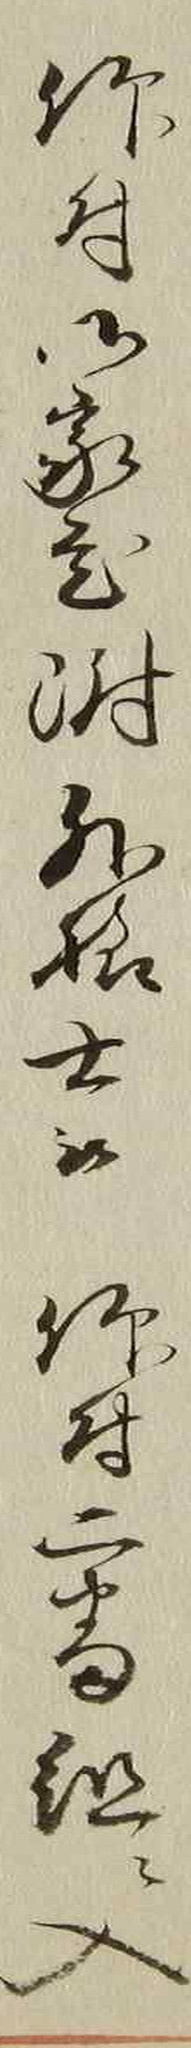仰付御家老附外様士被仰付二番組ニ入
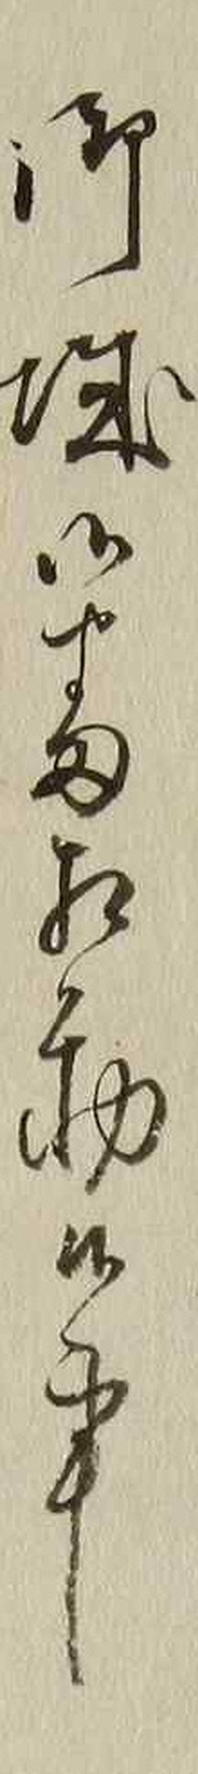御城御番相勤候事
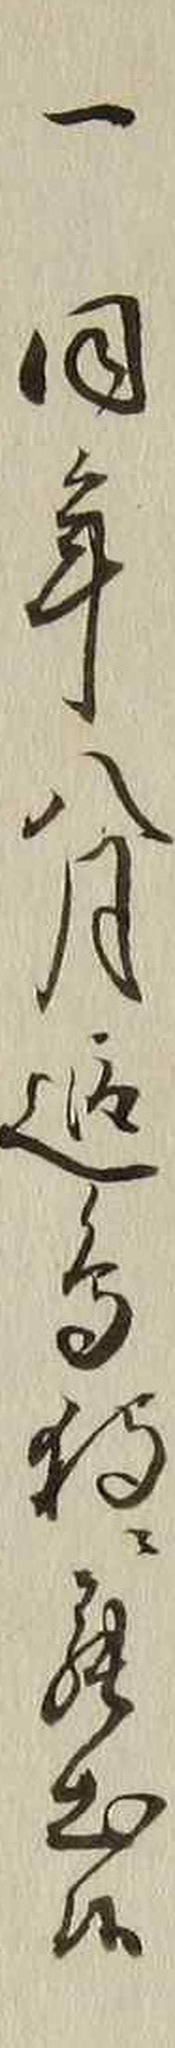一同年八月追鳥狩ニ罷出候
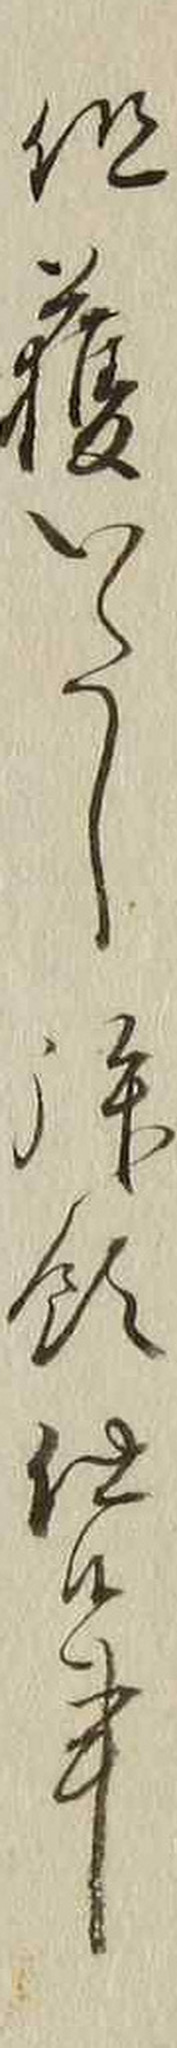但獲いたし拝領仕候事
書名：諸士系譜　巻之122　よ之部5
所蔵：会津若松市立会津図書館
